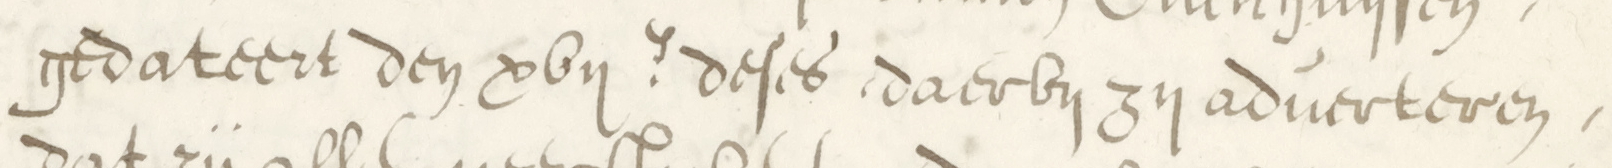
gedateert den xvije deses, daerby zy aduerteren
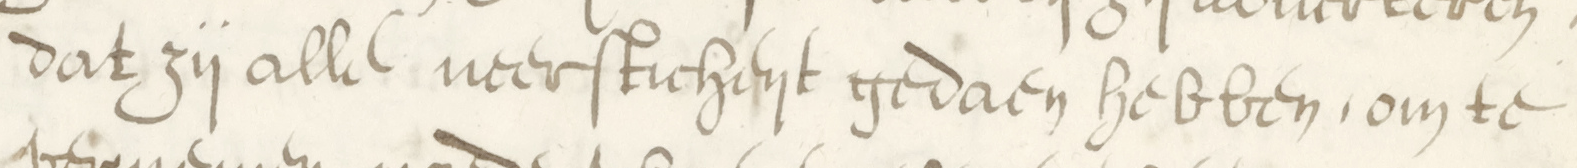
dat zij alle neersticheyt gedaen hebben, om te
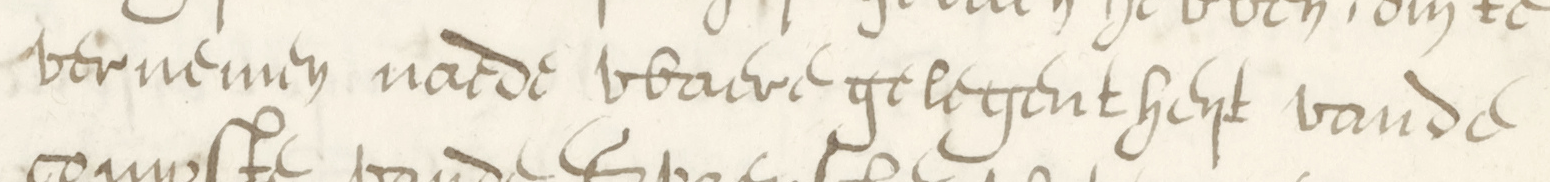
vernemen naede waere gelegentheyt vande
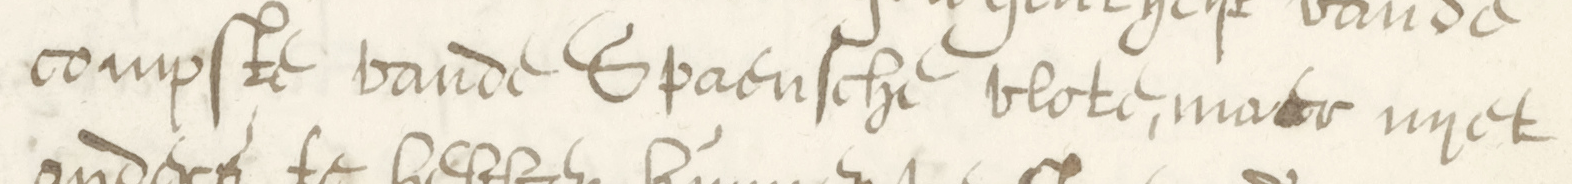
compste vande Spaensche vlote, maer nyet
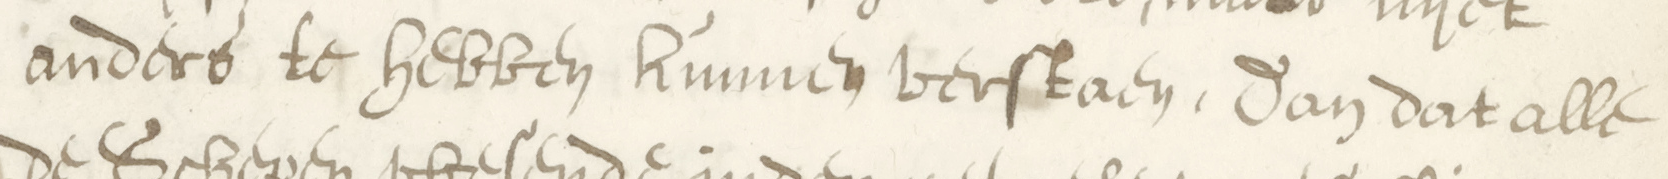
anders te hebben kunnen verstaen, dan dat alle
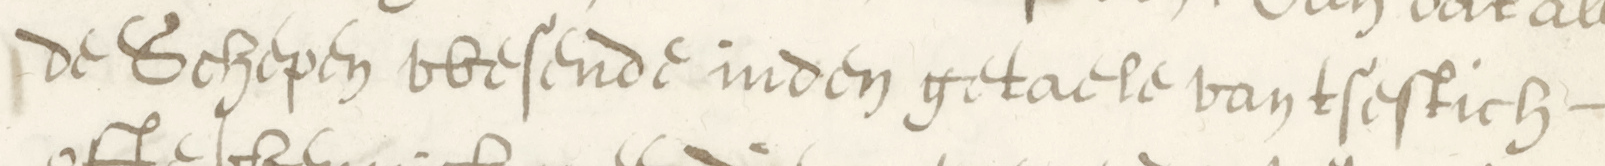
de Schepen wesende inden getaele van tsestich
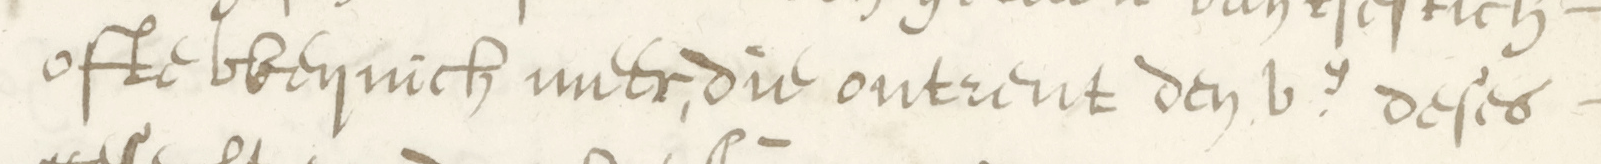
ofte weynich meer, die ontrent den ve deses
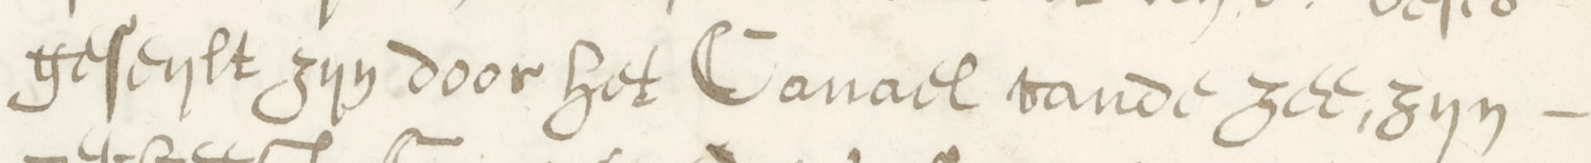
geseylt zyn door het Canael vande zee, zyn -
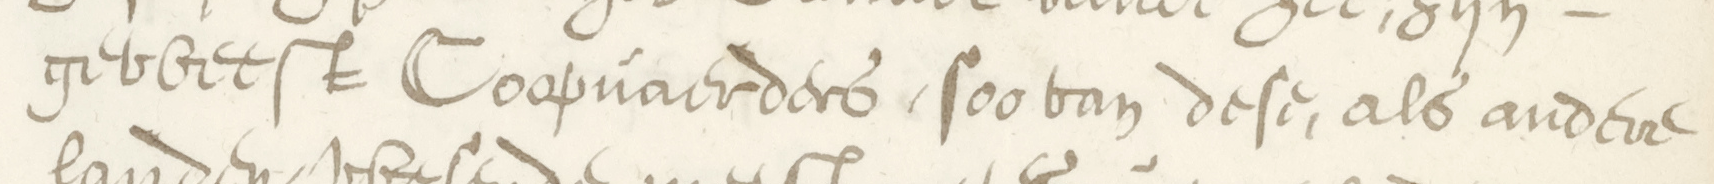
geweest Coopuaerders, soo van dese, als andere
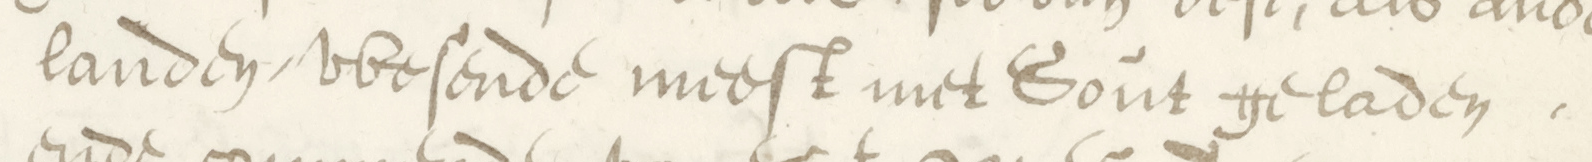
landen, wesende meest met Sout geladen,
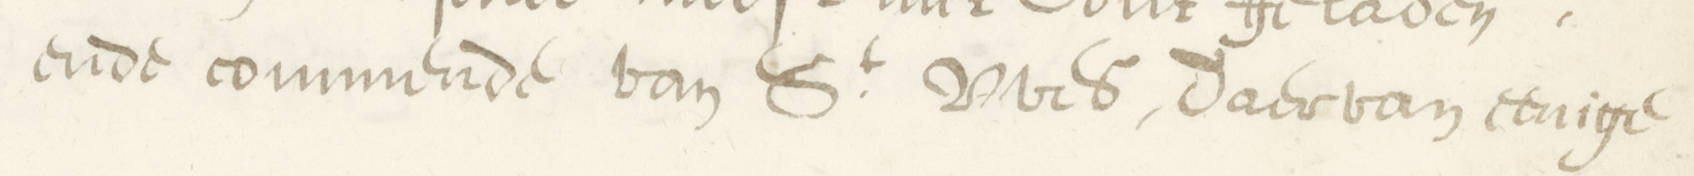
ende commende van St. Yves, daervan eenige
